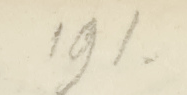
191.
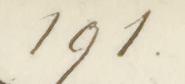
191
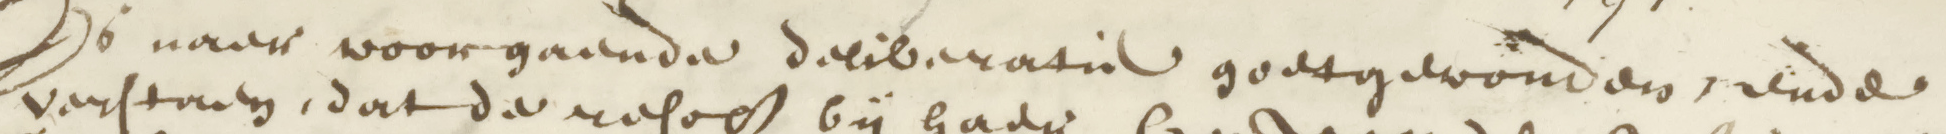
Is naer voorgaende deliberatie goetgevonden, ende
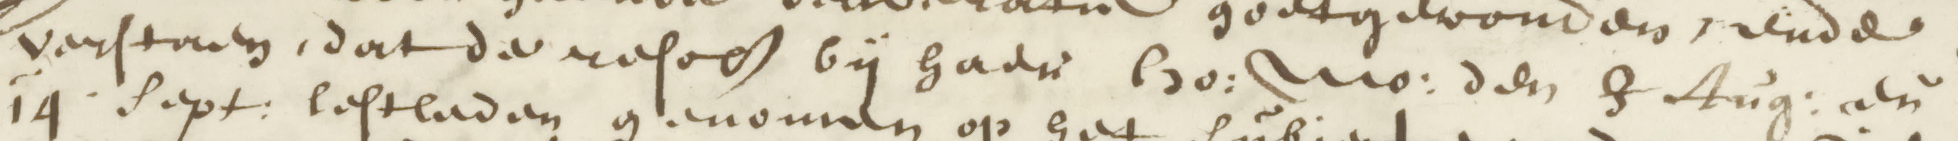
verstaen, dat de resol bij haer Ho:Mo: den 3. Aug: en
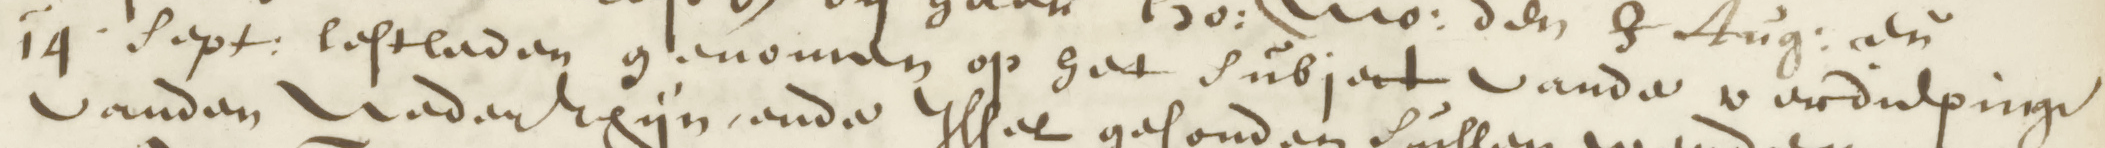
14. sept: lestleden genomen op het subject vande verdiepinge
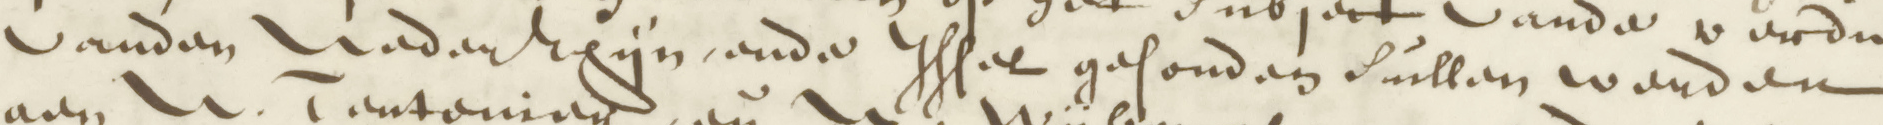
vanden Nederrhijn, ende Issel gesonden sullen werden
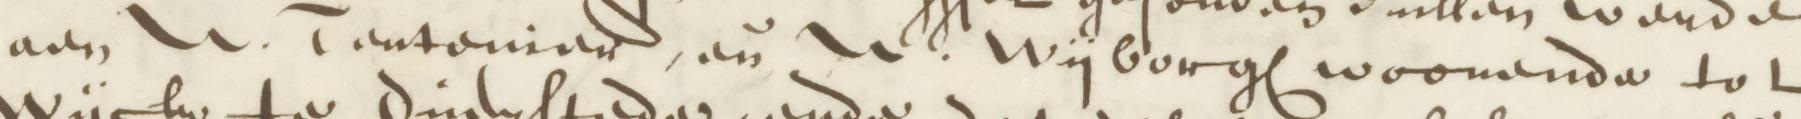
aen N. Tentenier, en N. Wijborgh woonende tot
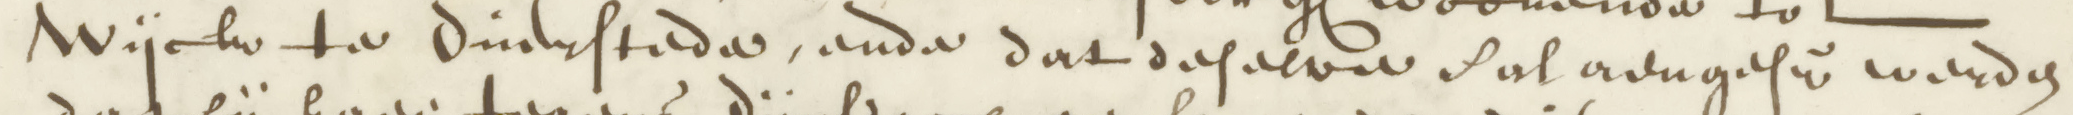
Wijck te Duerstede, ende dat deselve sal aengesr werden
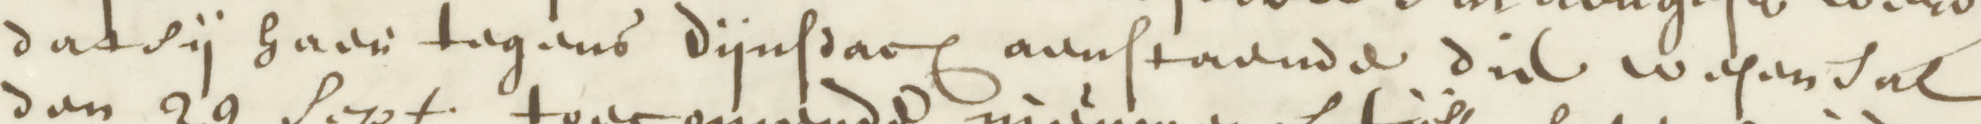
dat sij haer tegens dijnsdach aenstaende die wesen sal
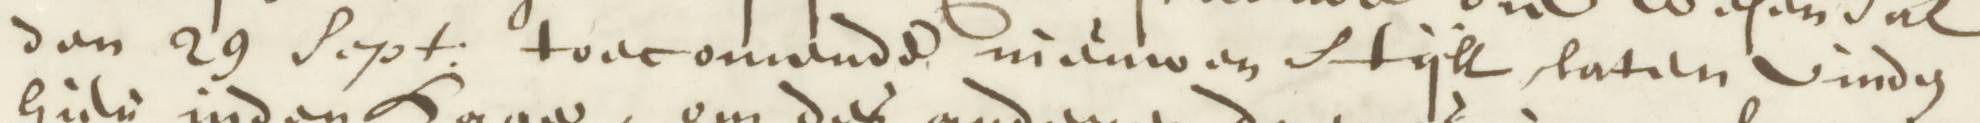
den 29 Sept: toecomende nieuwen stijll, laten vinden
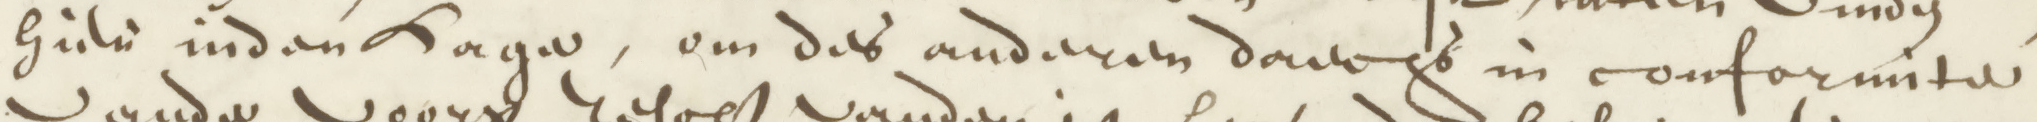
hier inden Hage, om des anderen daechs in conformité
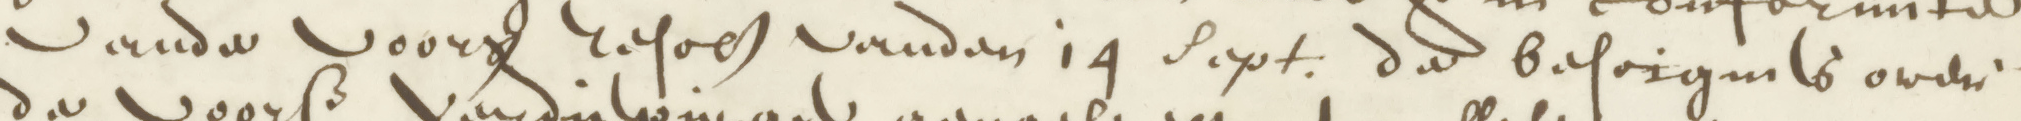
vande voors. resol vanden 14 Sept: die besoignes over
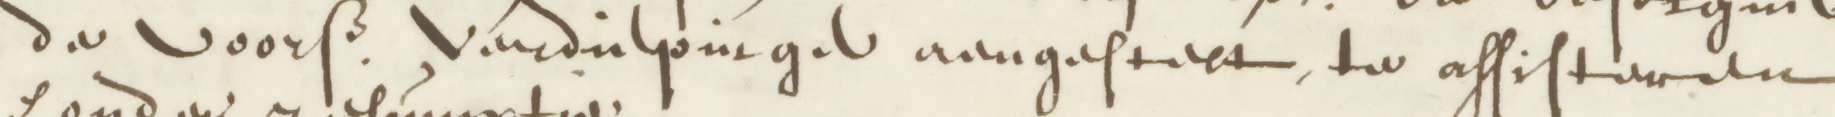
de voors. verdiepinge aengestelt, te assisteren
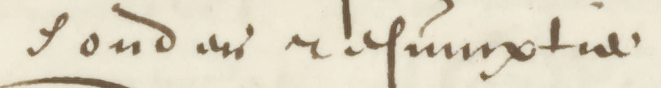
sonder resumptie.
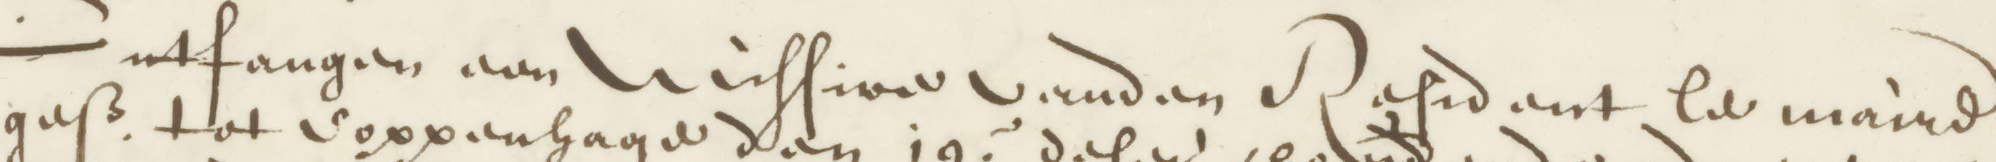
Ontfangen een Missive vanden Resident le maire
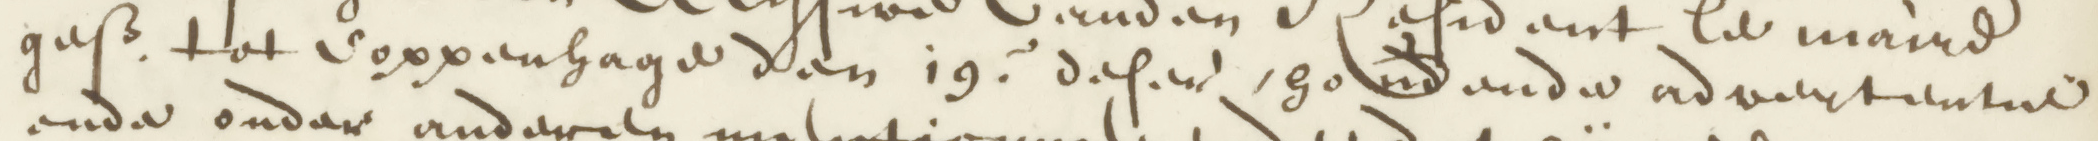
ges. tot coppenhage den 19e. deser, houdende advertentie
